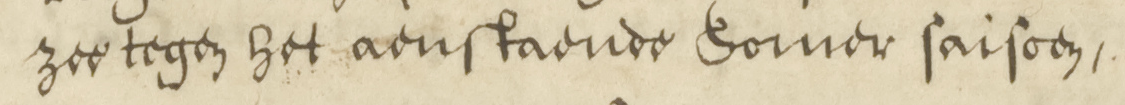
zee tegen het aenstaende somer saison.
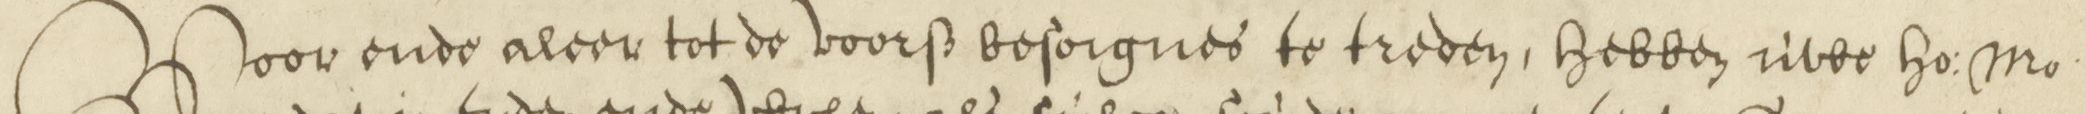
Voor ende aleer tot de voors besoignes te treden, hebben uwe Ho:Mo:
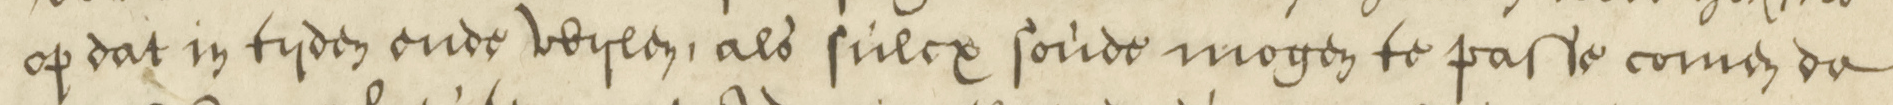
opdat in tyden ende wylen, als sulcx soude mogen te passe comen de
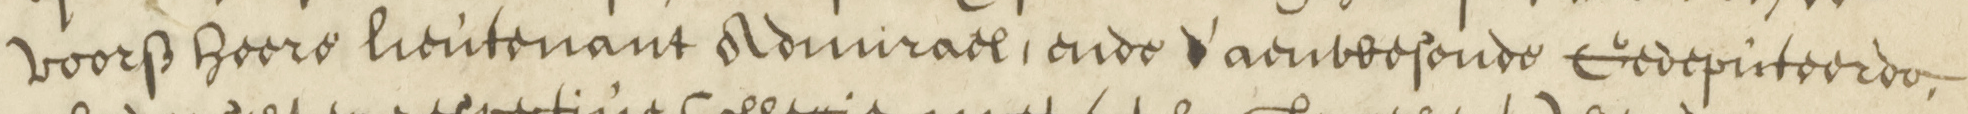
voors heere lieutenant Admirael, ende d'aenwesende Gedeputeerde,
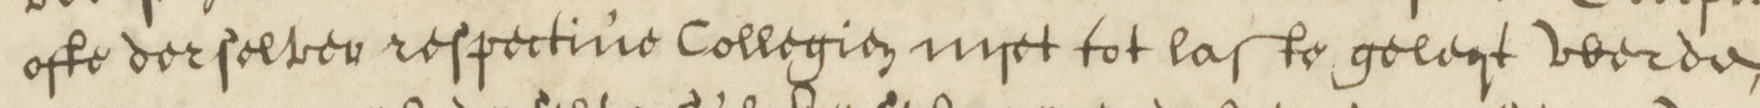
ofte derselver respectiue Collegien nyet tot laste geleyt werde,
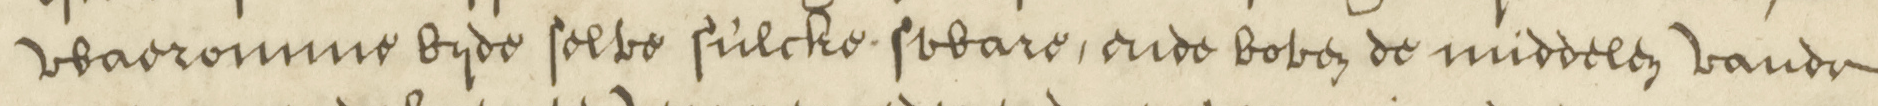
waeromme byde selve sulcke sware, ende boven de middelen vande
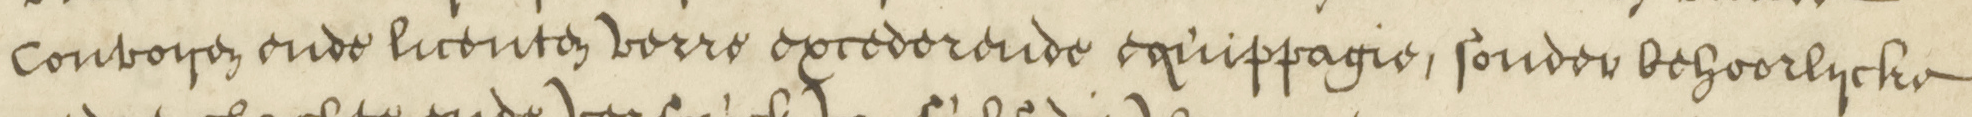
convoyen ende licenten verre excederende equippagie, sonder behoorlycke
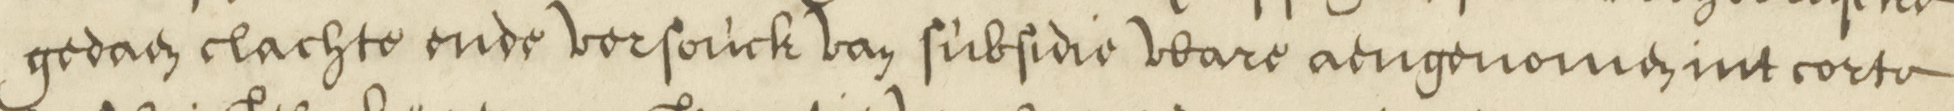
gedaen clachte ende versouck van subsidie ware aengenomen int corte
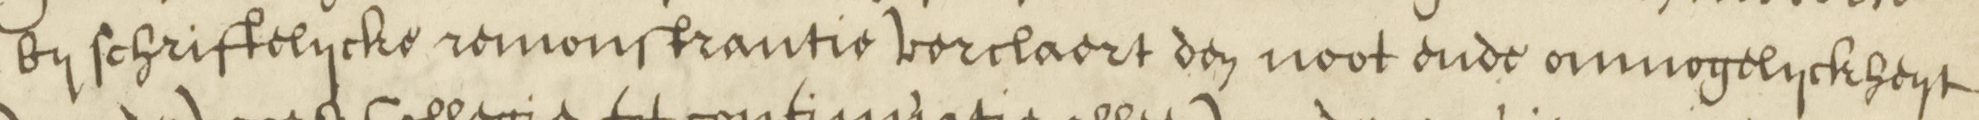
by schriftelycke remonstrantie verclaert den noot ende onmogelyckheyt
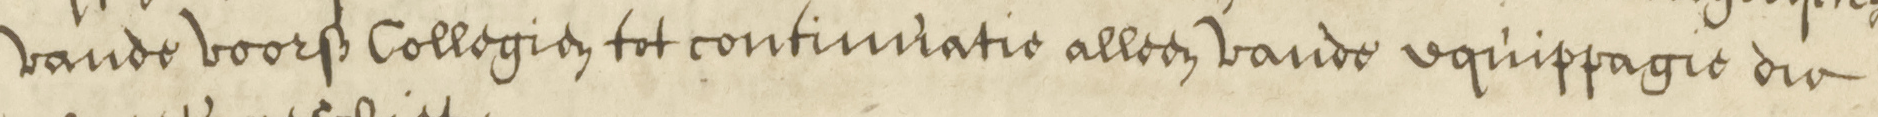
vande voors Collegien tot continuatie alleen vande equippagie die
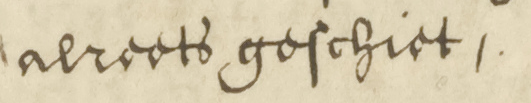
alreets geschiet.
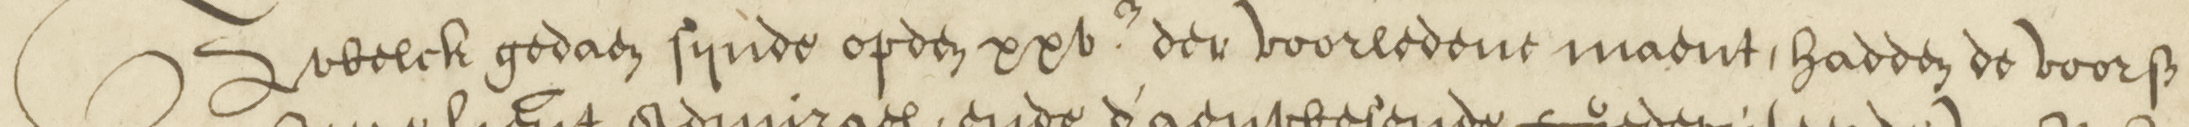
Twelck gedaen synde opden xxven der voorledene maent, hadden de voors
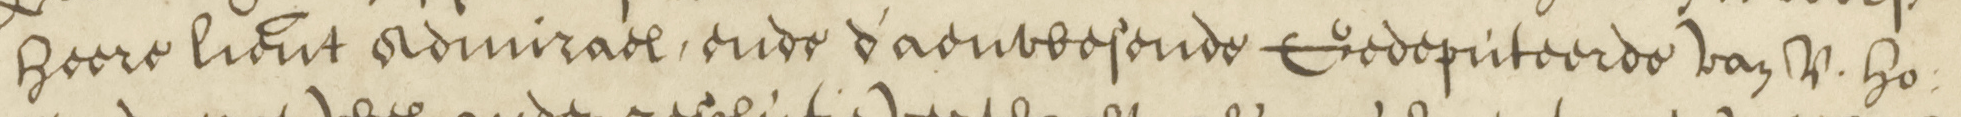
heere lieut Admirael, ende d'aenwesende Gedeputeerde van U. Ho:
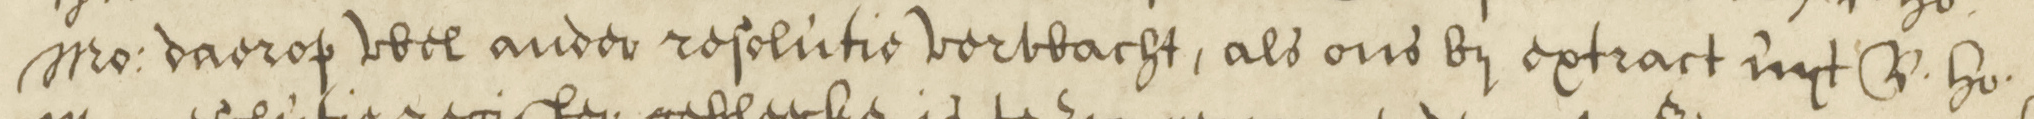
Mo: daerop wel ander resolutie verwacht, als ons by extract uyt U. Ho:
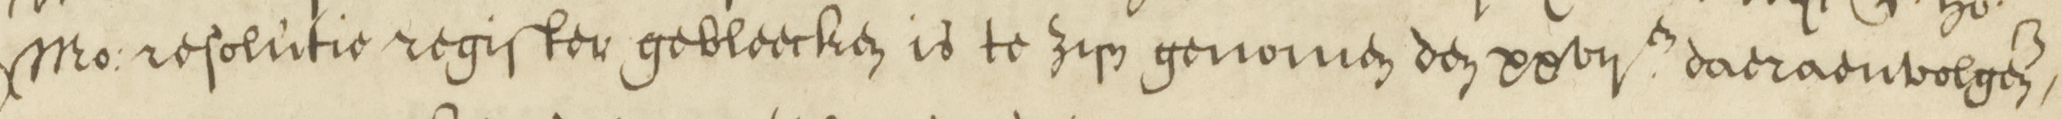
Mo: resolutie register gebleecken is te zyn genomen den xxvijen daeraenvolgen.
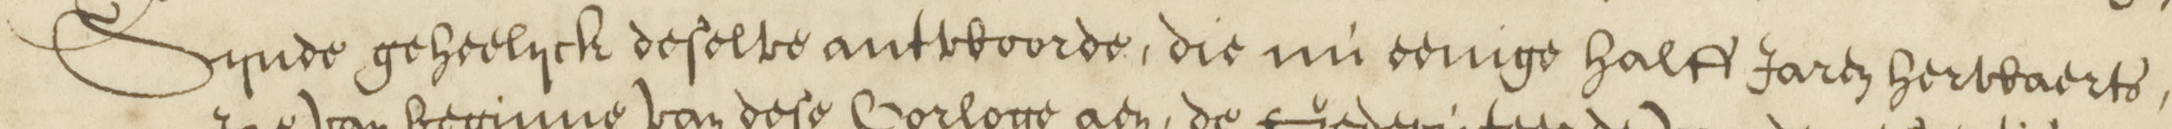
Synde geheeyjck deselve antwoorde, die nu eenige halff jaren herwaerts
